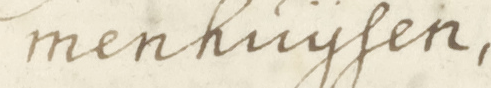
menhuijsen.
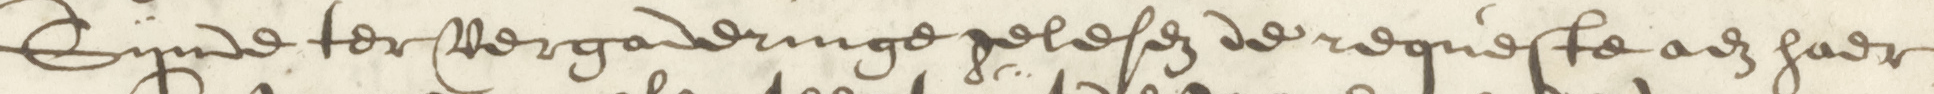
Sijnde ter Vergaderinge gelesen de requeste aen haer
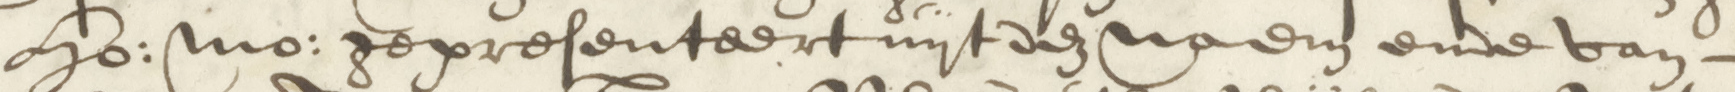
Ho:Mo: gepresenteert uijt den naem ende van —
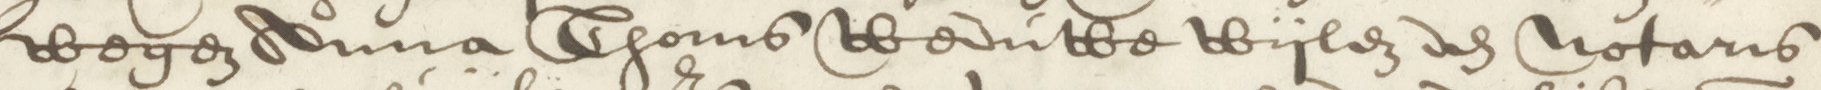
wegen Anna Thonis weduwe wijlen den notaris
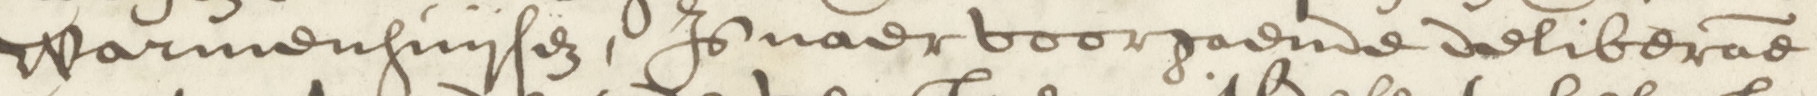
Warmenhuijsen, Is naer voorgaende deliberae
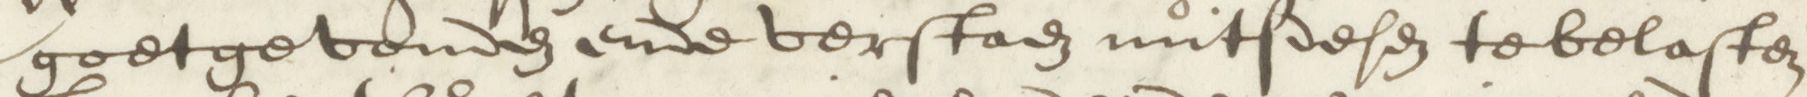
goetgevonden ende verstaen mitsdesen te belasten
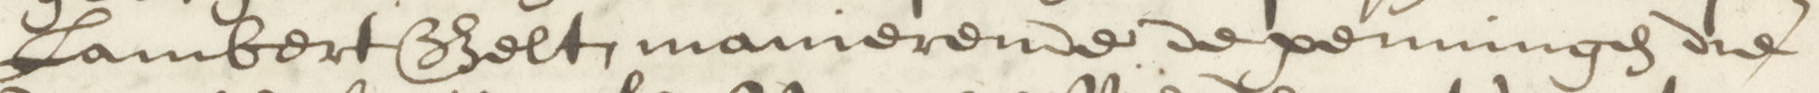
Lambert Belt, manierende de penningen die
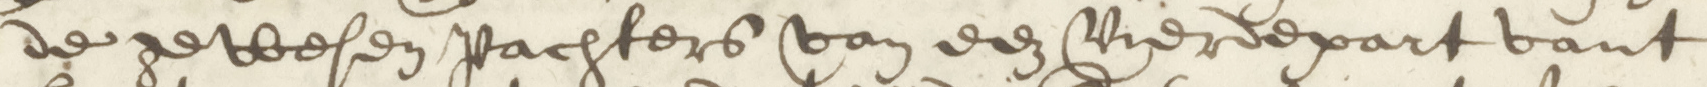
de gewesen Pachters van een Vierdepart vant
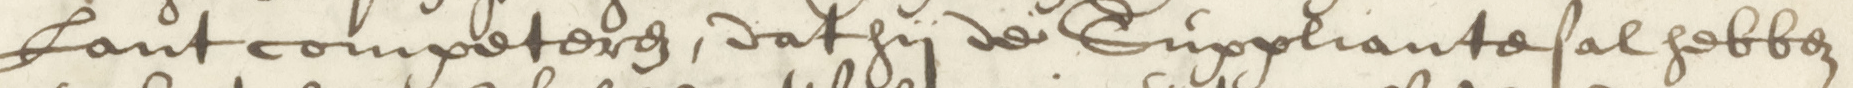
Lant competeren, dat hij de Suppliante sal hebben
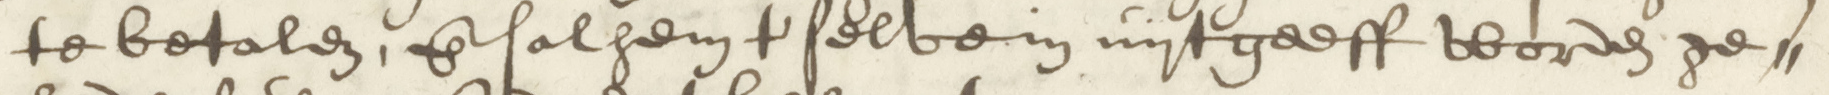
te betalen, & sal hem t'selve in uijtgeeff worden ge„
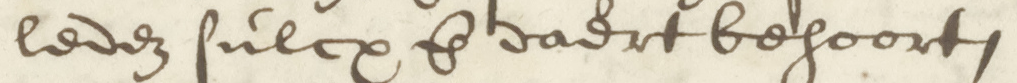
leden sulcx, & daert behoort.
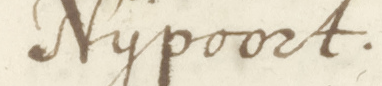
Nijpoort.
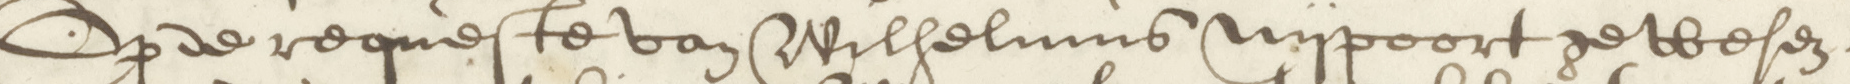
Op de requeste van Wilhelmus Nijpoort gewesen
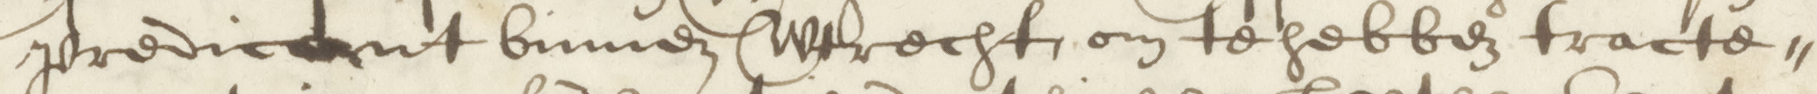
predicant binnen Wtrecht, om te hebben tracte„
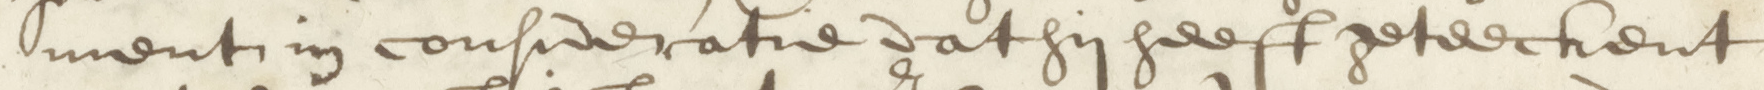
ment in consideratie dat hij heeft geteeckent
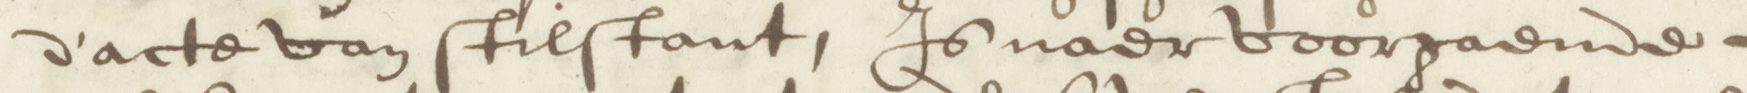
d'acte van stilstant, Is naer voorgaende
